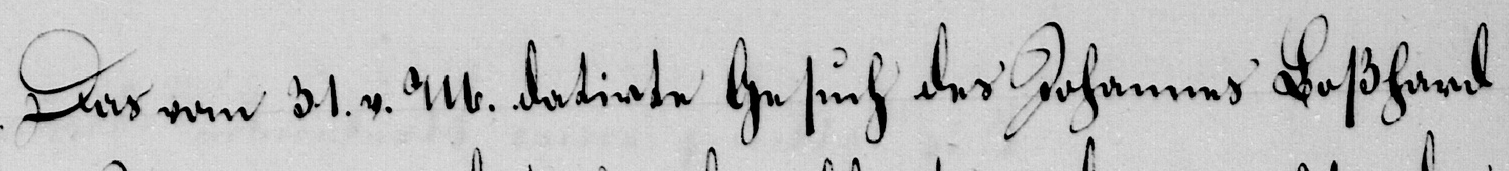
Das vom 31. v. M. datirte Gesuch des Johannes Boßhard
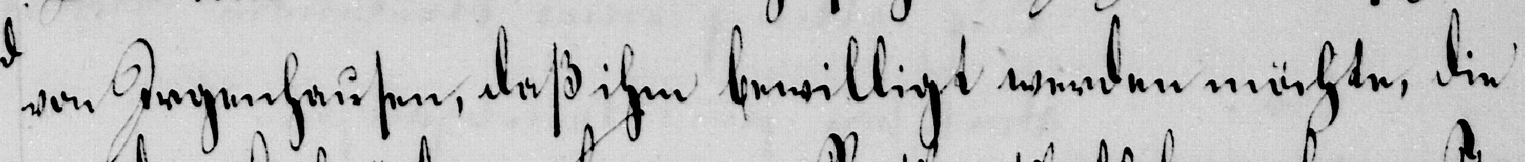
von Irgenhausen, daß ihm bewilligt werden möchte, die
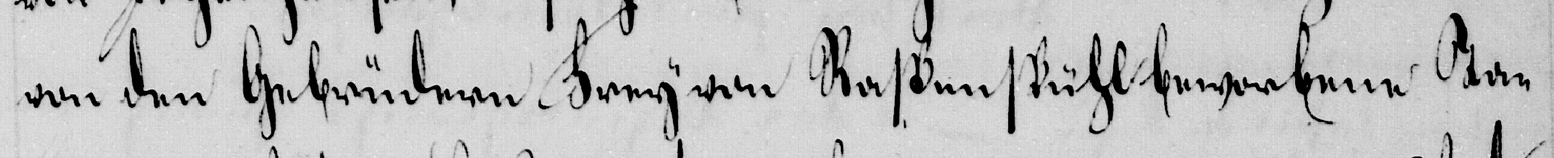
von den Gebrüdern Frey von Ravensbühl beworbene Ta¬
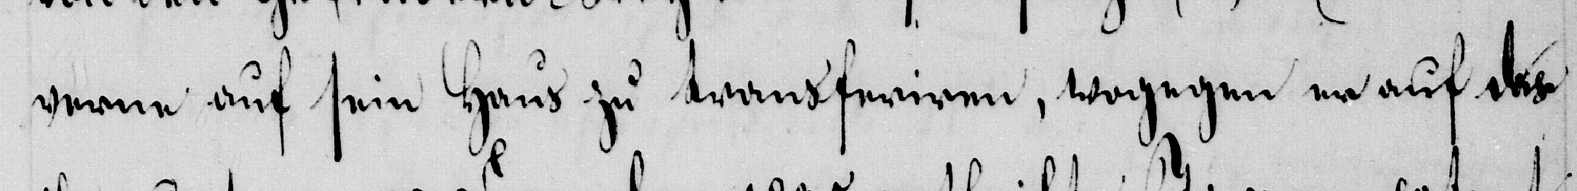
verne auf sein Haus zu transferiren, wogegen er auf das
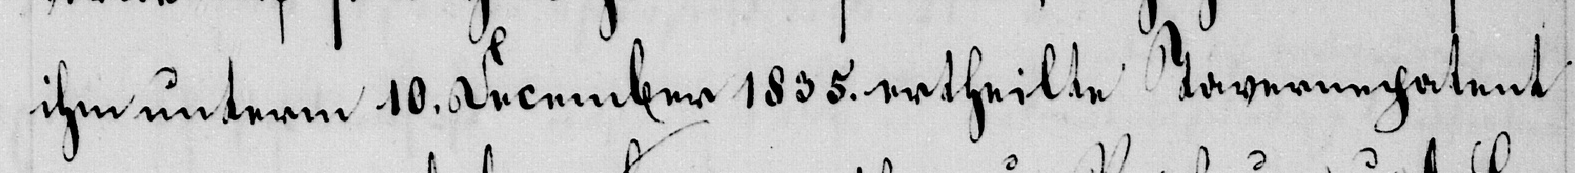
ihm unterm 10. December 1835 ertheilte Tavernepatent
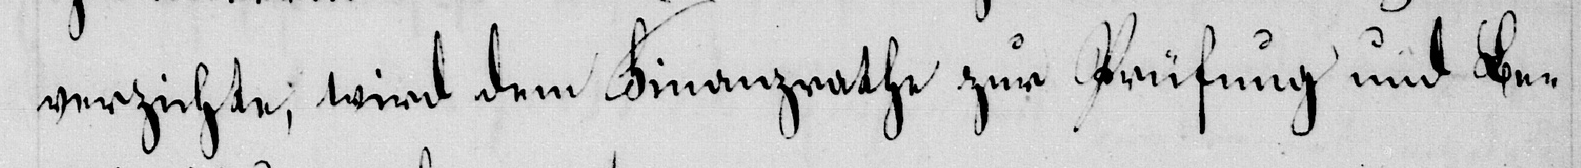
verzichte, wird dem Finanzrathe zur Prüfung und Be¬
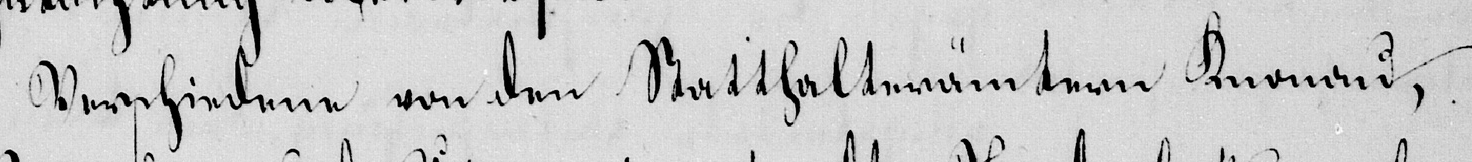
Verschiedene von den Statthalterämtern Knonau,
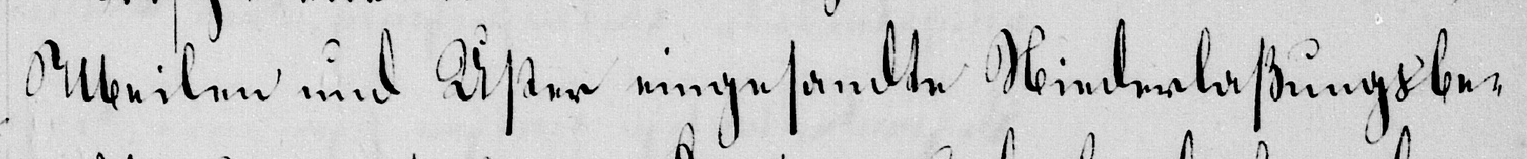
Meilen und Uster eingesandte Niederlaßungsbe¬
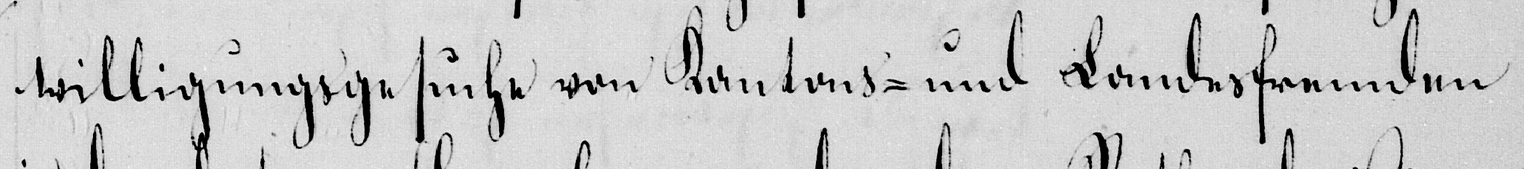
willigungsgesuche von Kantons- und Landesfremden
